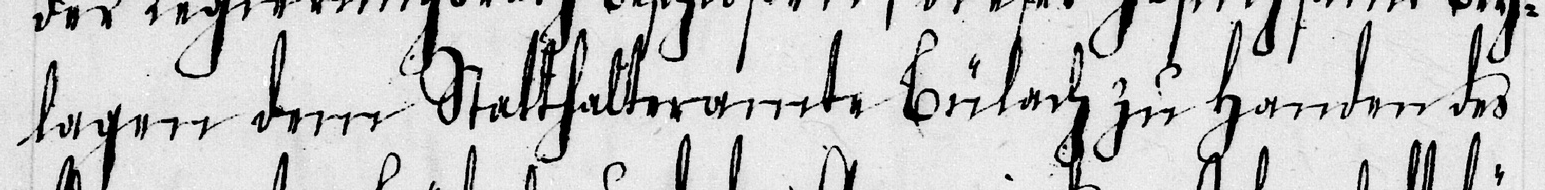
lagen dem Statthalteramte Bülach zu Handen des
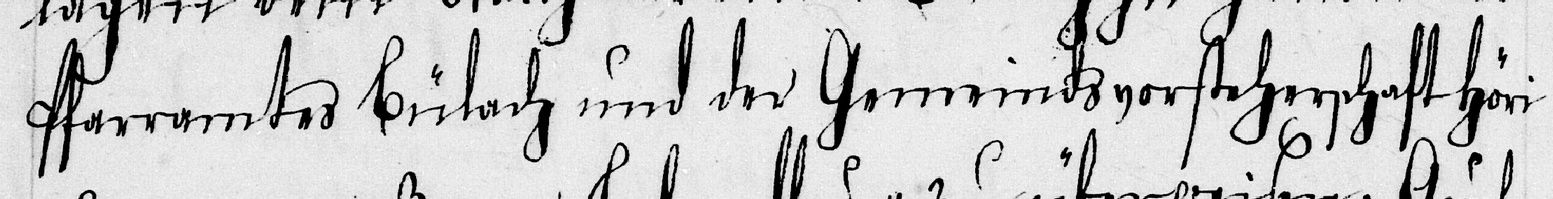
Pfarramtes Bülach und der Gemeindsvorsteherschaft Höri
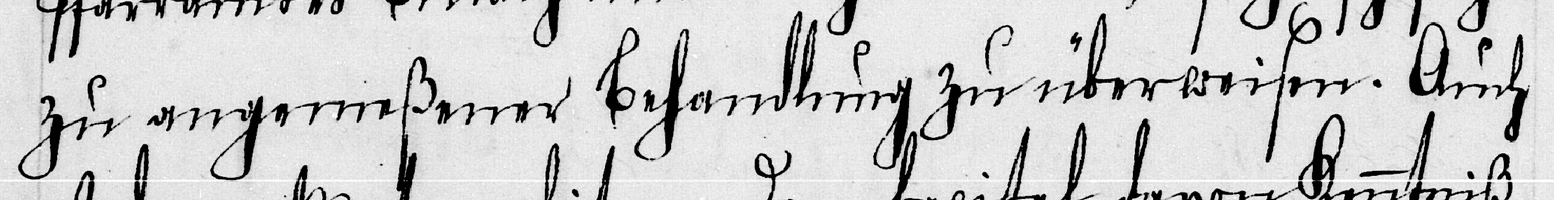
zu angemeßener Behandlung zu überweisen. Auch
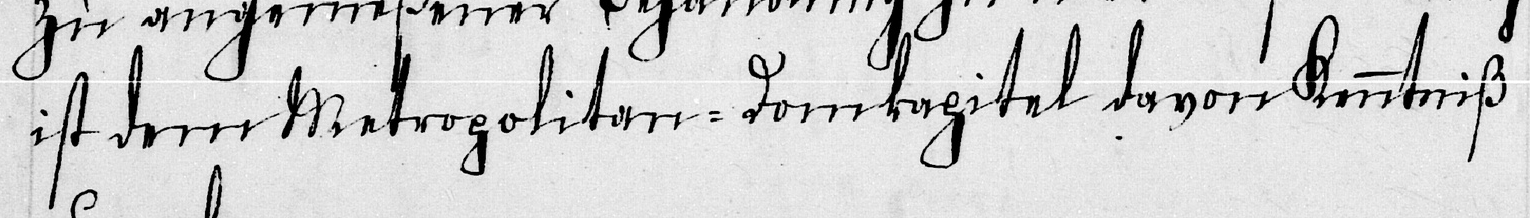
ist dem Metropolitan-Domkapitel davon Kenntniß
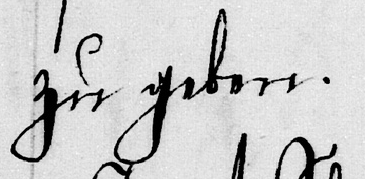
zu geben.
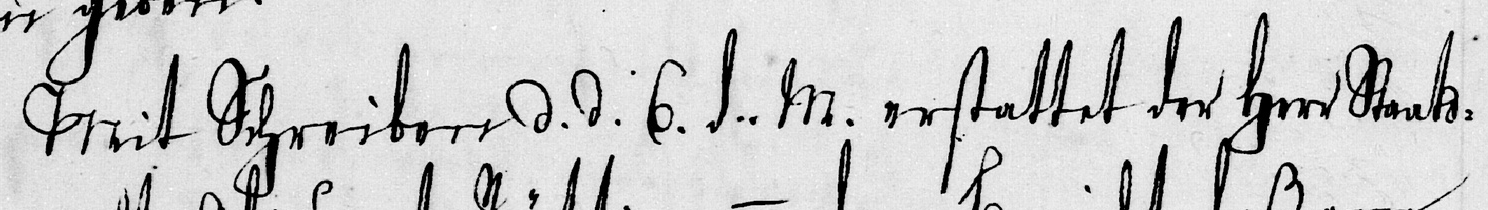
Mit Schreiben d. d. 6. d. M. erstattet der Herr St¬
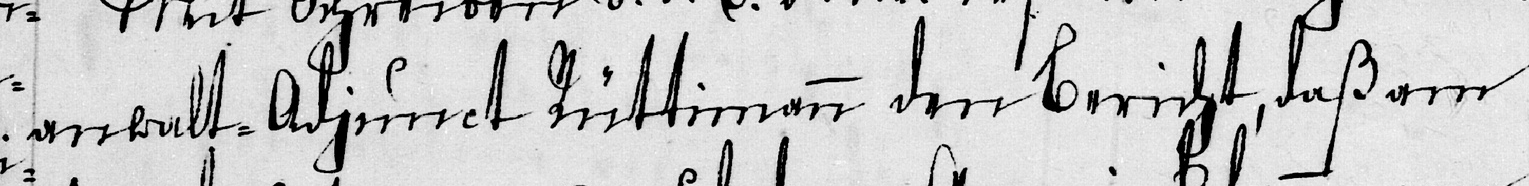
anwalt-Adjunct Rüttimann den Bericht, daß am
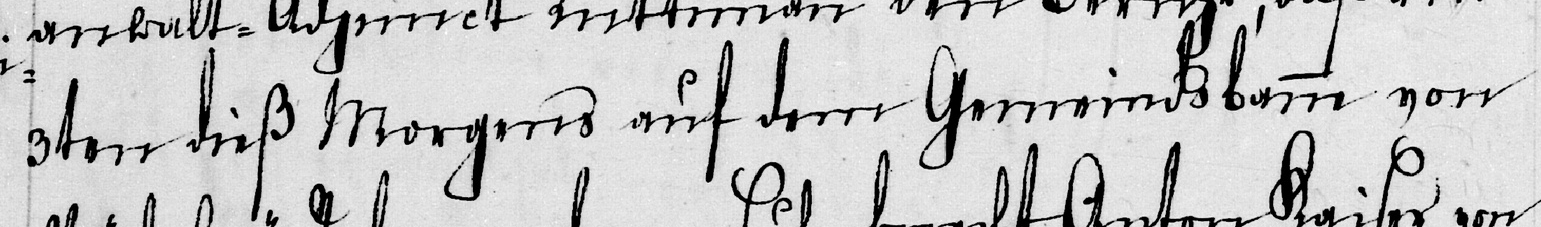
3ten dieß Morgens auf dem Gemeindsbann von
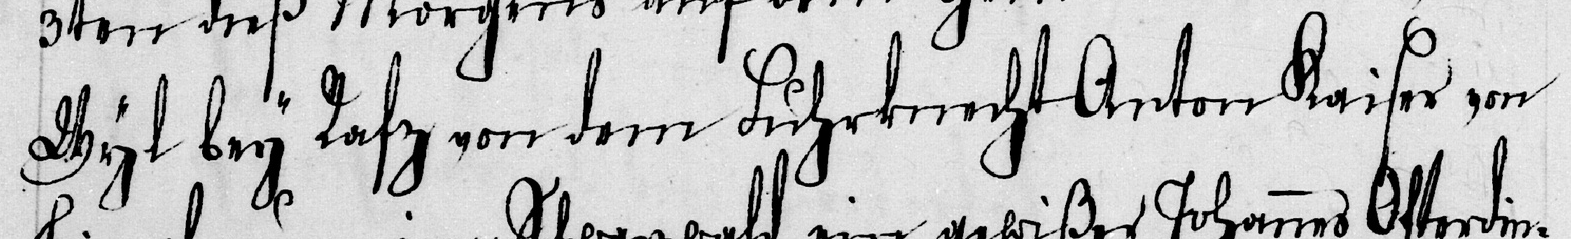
Wyl bey Rafz von dem Fuhrknecht Anton Kaiser von
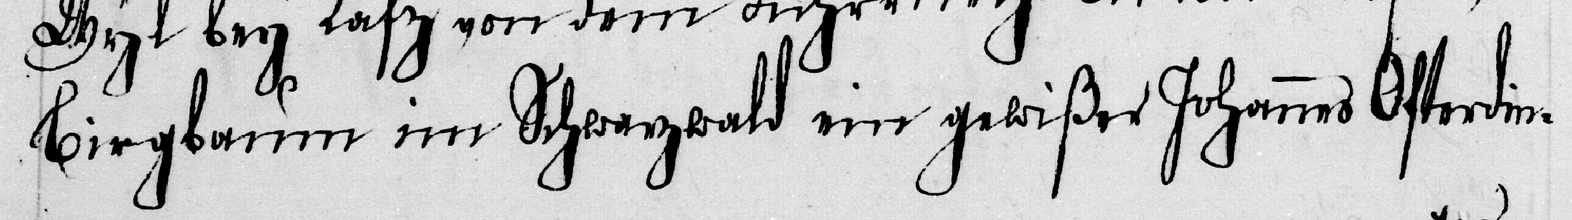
Birgbaum im Schwarzwald ein gewißer Johannes Osterdin-
